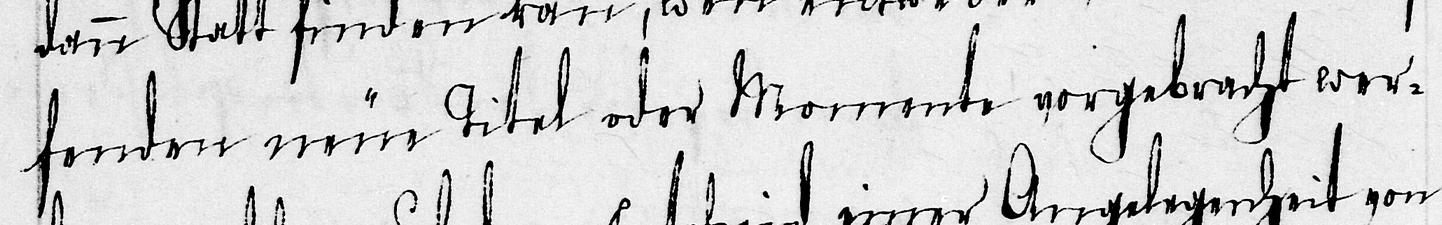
fenden neue Titel oder Momente vorgebracht wer¬
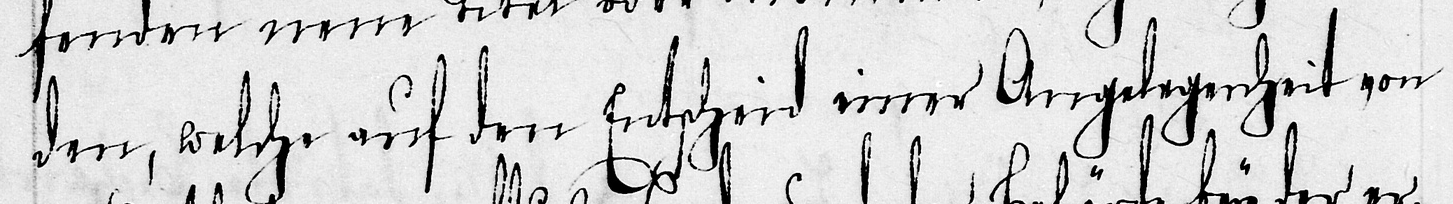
den, welche auf den Entscheid einer Angelegenheit von
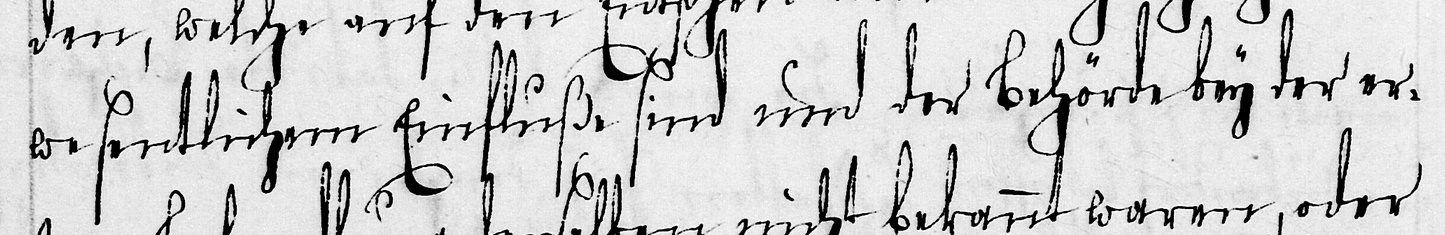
wesentlichen Einfluße sind und der Behörde bey der er¬
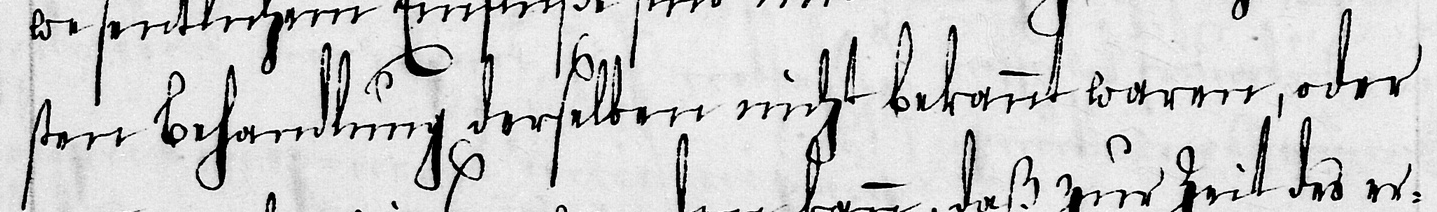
sten Behandlung derselben nicht bekannt waren, oder
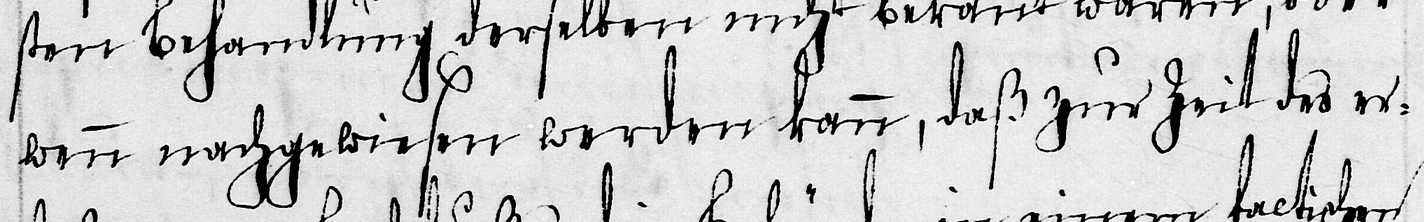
wenn nachgewiesen werden kann, daß zur Zeit des er¬
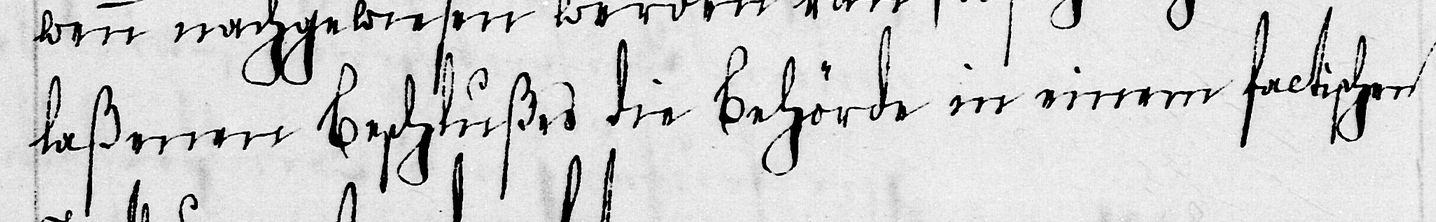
laßenen Beschlußes die Behörde in einem factischen
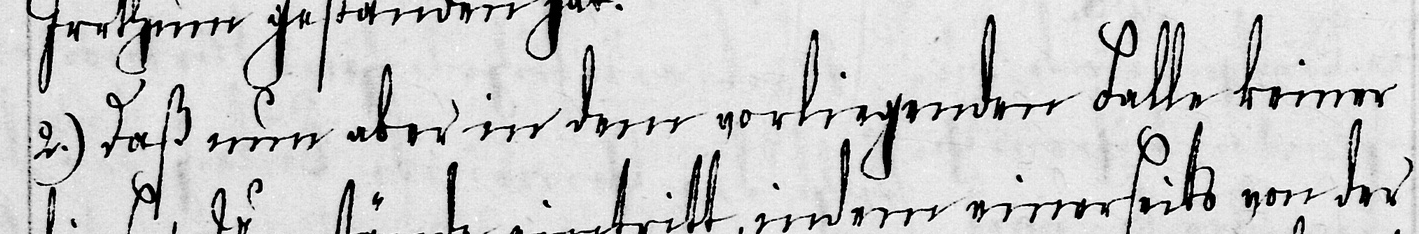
2) Daß nun aber in dem vorliegenden Falle keiner
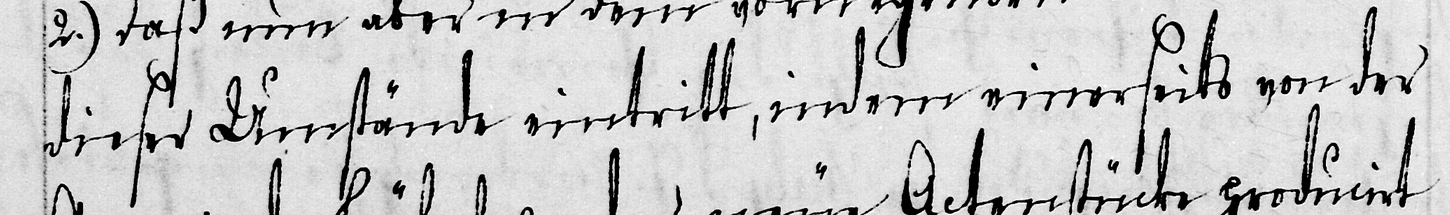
dieser Umstände eintritt, indem einerseits von der
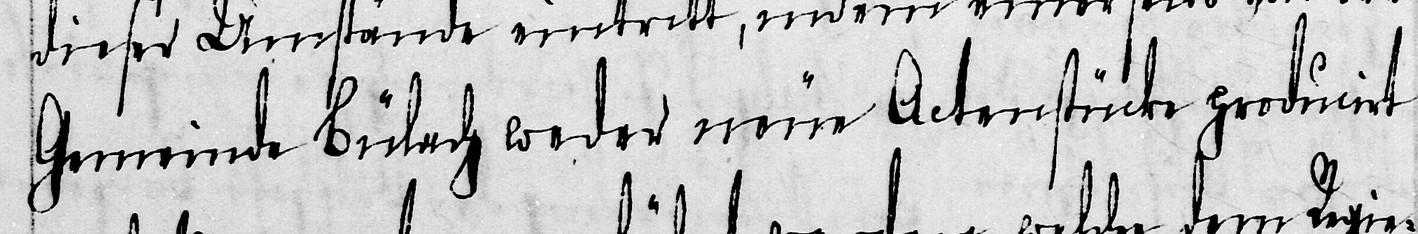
Gemeinde Bülach weder neue Actenstücke producirt
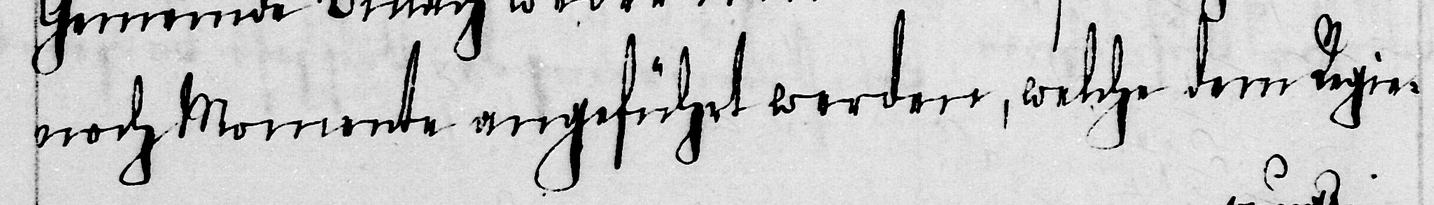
noch Momente angeführt werden, welche dem Regie-
